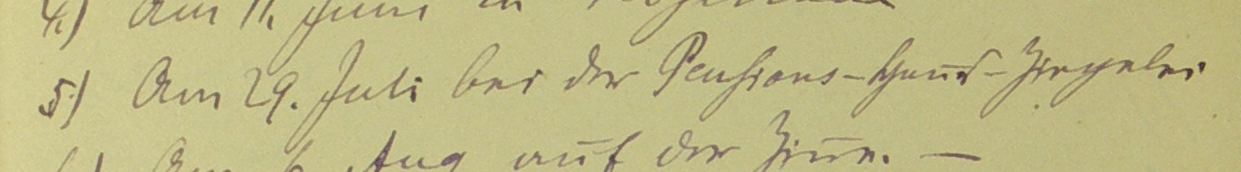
5.) * 29 Juli bei der Pensions-Haus-Ziegelei
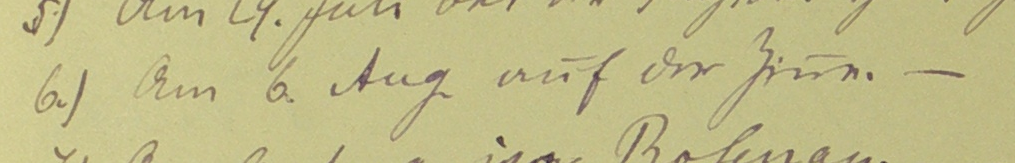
6.) + 6. August auf der Zinne
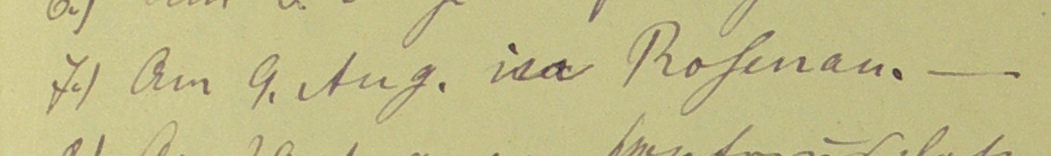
7.) * 9. August in Rosenau
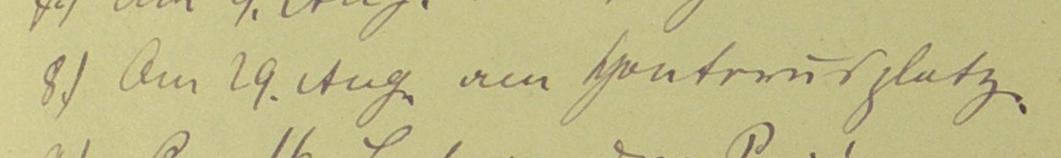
8.) * 29. August am Honterusplatz
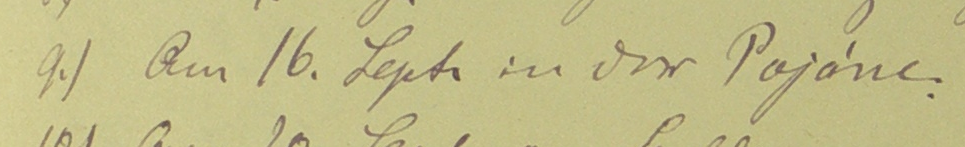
9.) * 16. Septem. In der Pojane
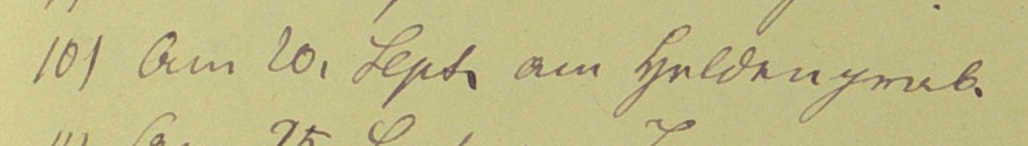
10.) * 20. Septem. am Heldendengrab
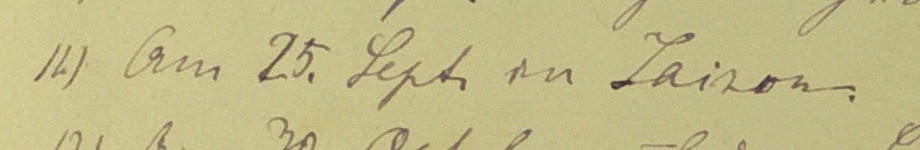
11.) * 25. Septem. In Zaizon
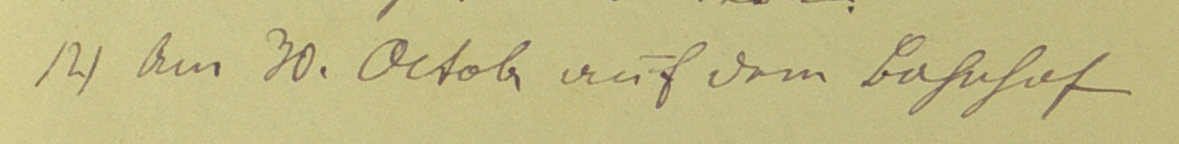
12.) * 30. Octob. auf dem Bahnhof
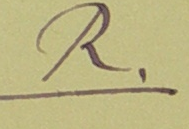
R
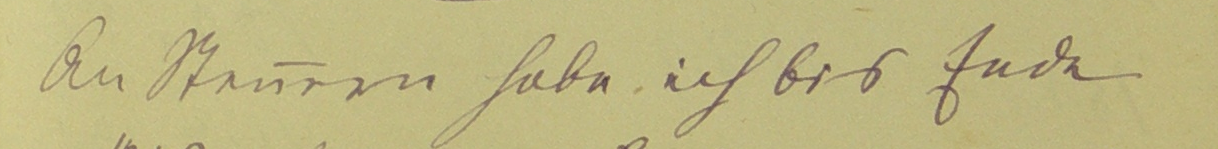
An Steuern habe ich bis Ende
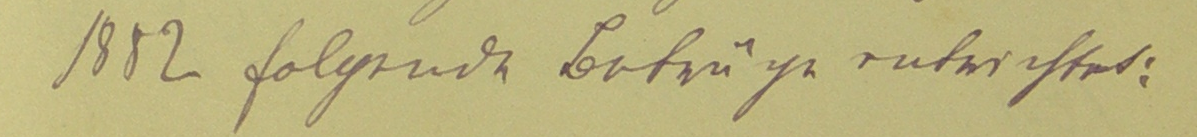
1882 folgende Beträge entrichtet:
